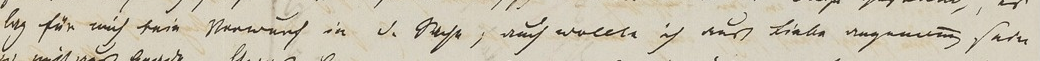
lag für mich kein Vorwurf in d. Sache; auch wollte ich aus Liebe angenommen sein
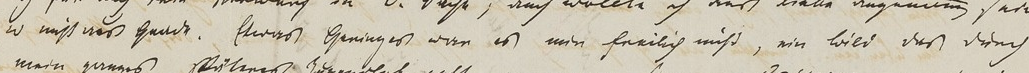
u nicht aus Gnade. Etwas Geringes war es mir freilich nicht, ein Bild das durch
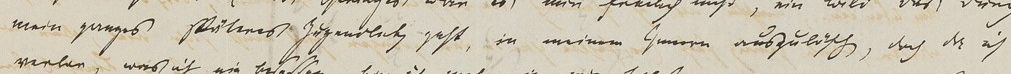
mein ganzes späteres Jugendleben geht, in meinem Innern auszulöschen, doch da ich
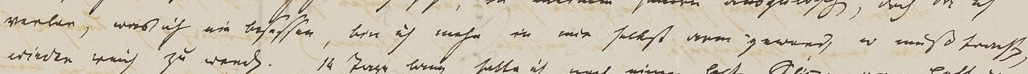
verlor, was ich nie besessen, bin ich mehr in mir selbst arm geworden u muß trachten,
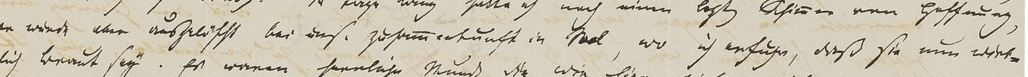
er wurde aber ausgelöscht bei uns. Zusammenkunft in Sool, wo ich erfuhr, daß sie nun wirk-
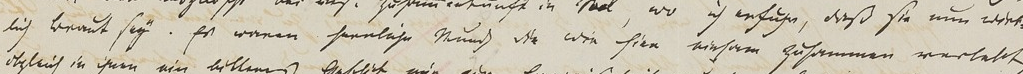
lich Braut sey. Es waren herrliche Stunden die wir hier einsam zusammen verlebten,
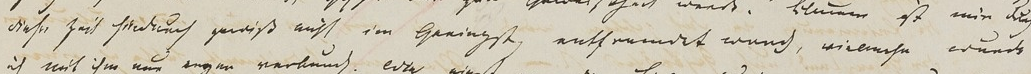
diese Zeit hindurch gewiß nicht im Geringsten entfremdet worden, vielmehr wurde
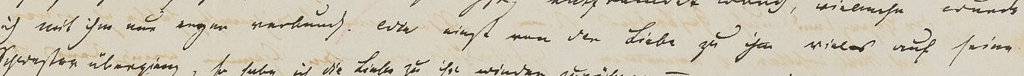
ich mit ihm nun enger verbunden. Wie einst von der Liebe zu ihm vieles auf seine
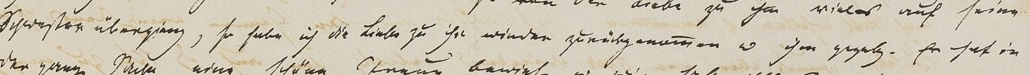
Schwester übergieng, so habe ich die Liebe zu ihr wieder zurückgenommen u ihm gegeben. Er hat in
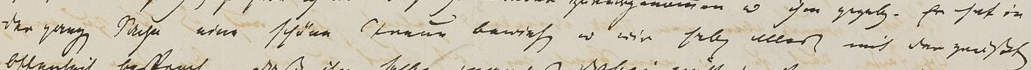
der ganzen Sache eine schöne Treue bewiesen u wir haben alles mit der größten
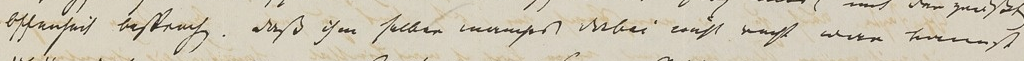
Offenheit besprochen. Daß ihm selber manches dabei nicht recht war kannst
